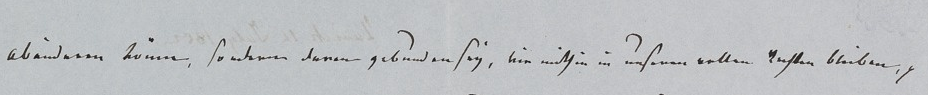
abändern könne, sondern daran gebunden sey, wir mithin in unseren vollen Rechten bleiben, &
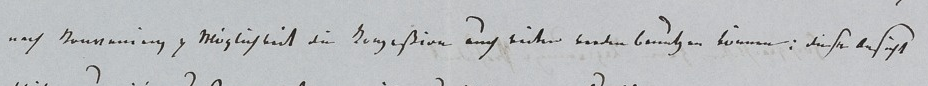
nach Konvenienz & Möglichkeit die Konzeßion auch weiter werden benutzen können: diese Ansicht
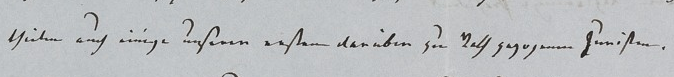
theilen auch einige unserer ersten darüber zu Rath gezogenen Juristen.
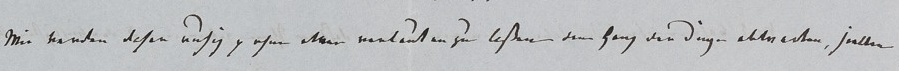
Wir werden daher ruhig & ohne etwas verlauten zu laßen den Gang der Dinge abwarten, halten
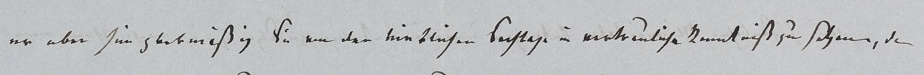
es aber für zwekmäßig Sie von der wirklichen Sachlage in vertrauliche Kenntniß zu setzen, da
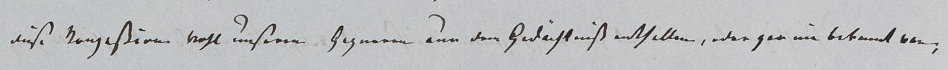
diese Konzeßion wohl unseren Gegneren aus dem Gedächtniß entfallen, oder gar nie bekannt war;
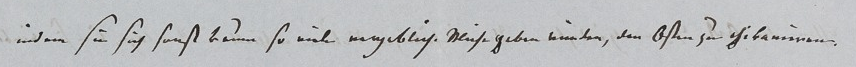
indem sie sich sonst kaum so viele vergebliche Mühe geben würden, den Osten zu chikanieren.
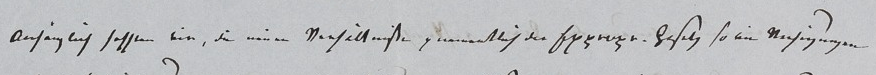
Anfänglich hofften wir, die neuen Verhältniße & namentlich das Expropr. Gesetz so wie Verfügungen
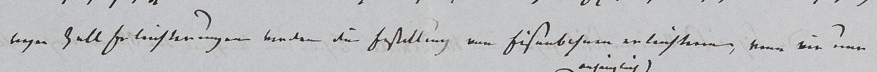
wegen Zoll Erleichterungen werden die Erstellung von Eisenbahnen erleichteren, wenn wir uns
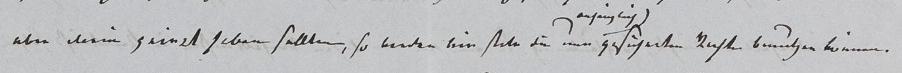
aber darin geirrt haben sollten, so werden wir stets die nur anfänglich gesicherten Rechte benutzen können.
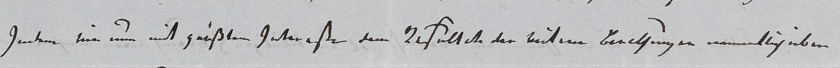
Indem wir nun mit größtem Intereße dem Resultate der weitern Berathungen namentlich über
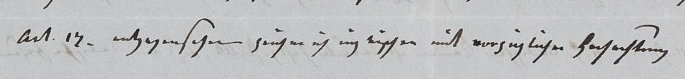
Art. 17. entgegensehen zeichne ich inzwischen mit vorzüglicher Hochachtung
